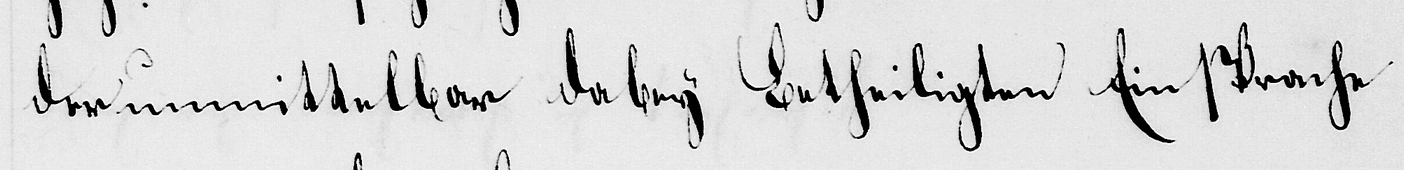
der unmittelbar dabey Betheiligten Einsprache
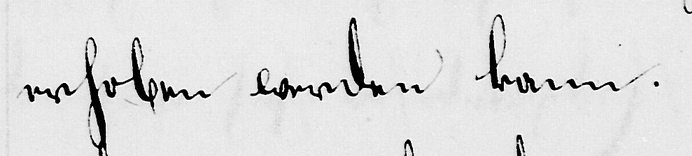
erhoben werden kann.
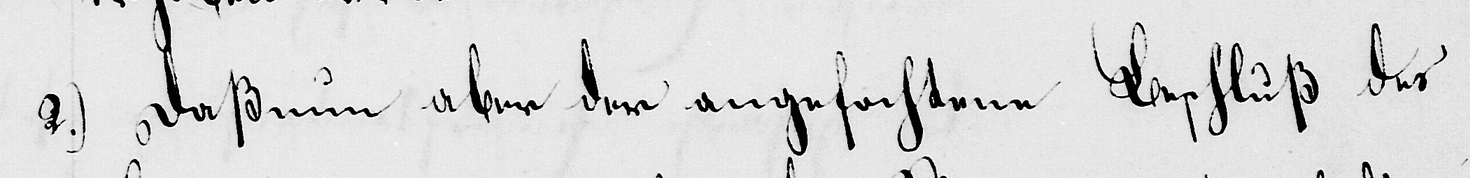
2.) Daß nun aber der angefochtene Beschluß des
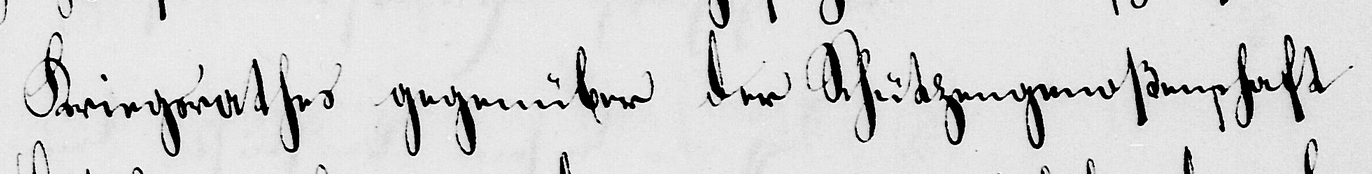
Kriegsrathes gegenüber der Schützengenoßenschaft
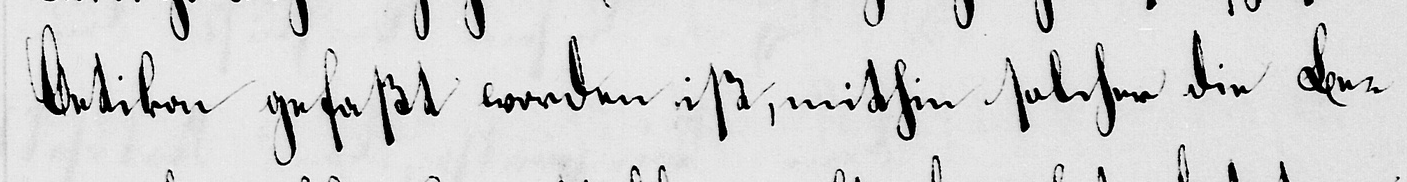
Oetikon gefaßt worden ist, mithin solcher die Be¬
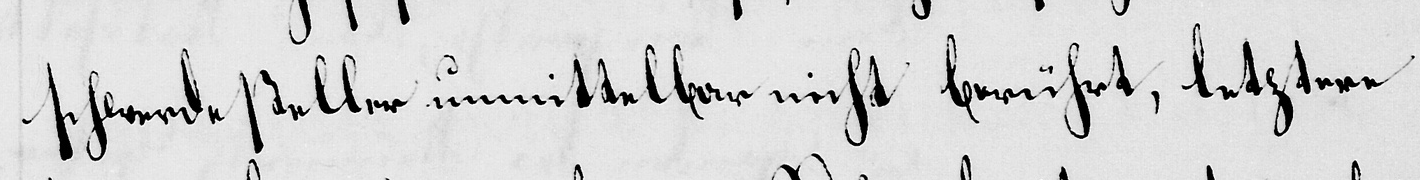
schwerdesteller unmittelbar nicht berührt, letztere
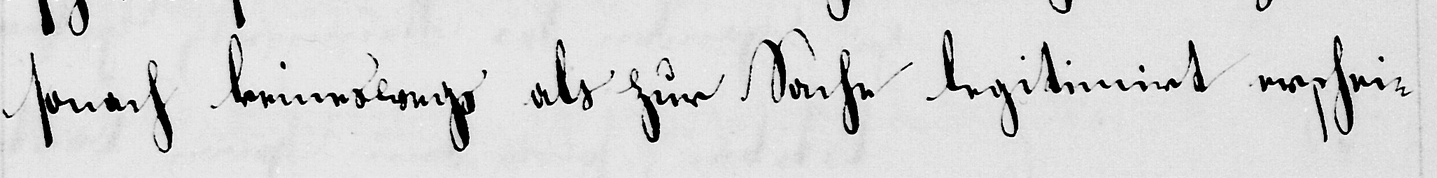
sonach keineswegs als zur Sache legitimirt erschei¬
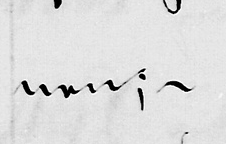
nen; –
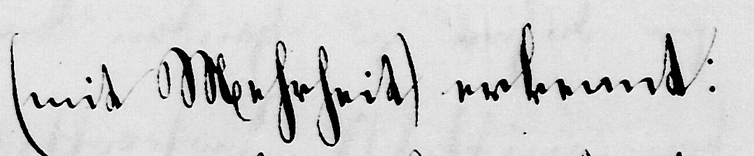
(mit Mehrheit) erkennt:
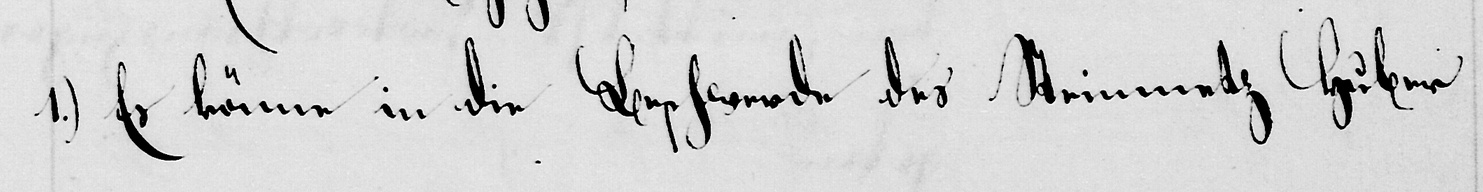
1.) Es könne in die Beschwerde des Steinmetz Huber
